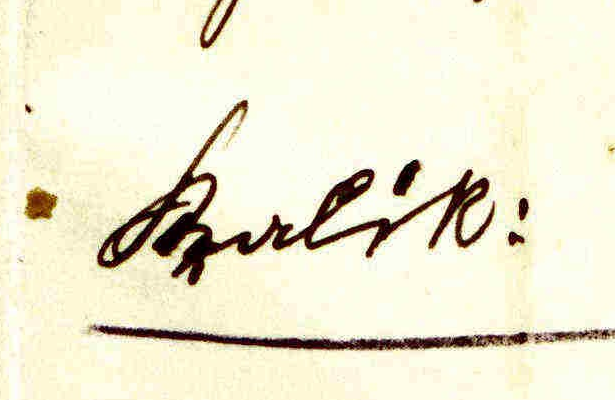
Kralik:
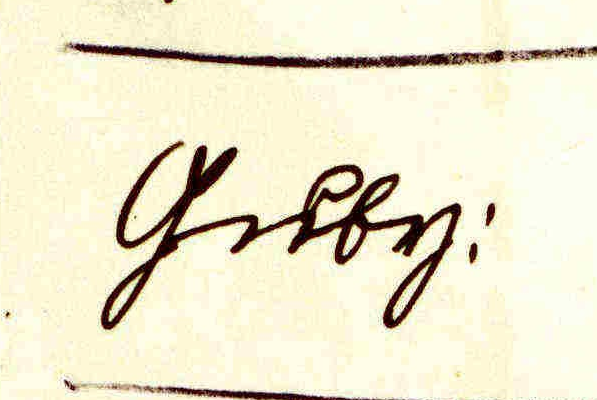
Guby:
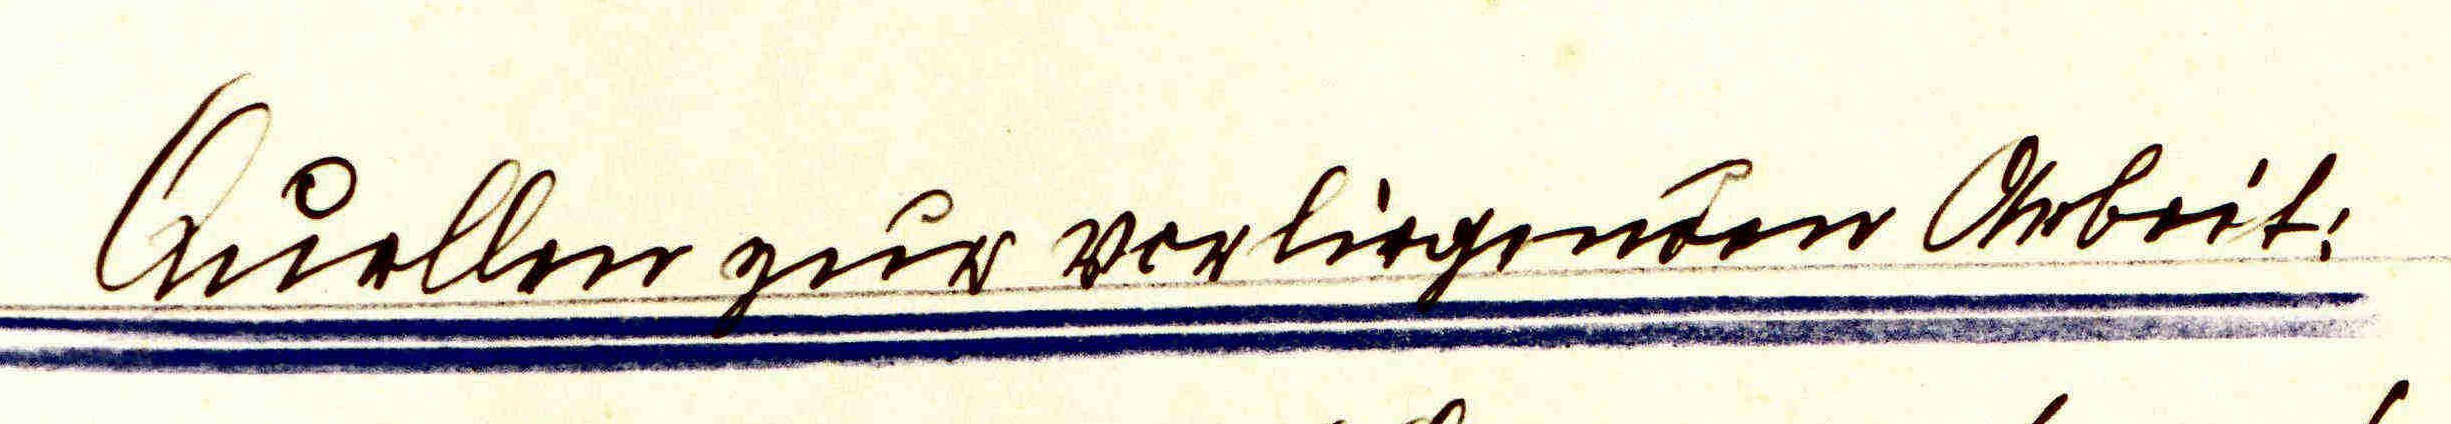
Quellen zur vorliegenden Arbeit:
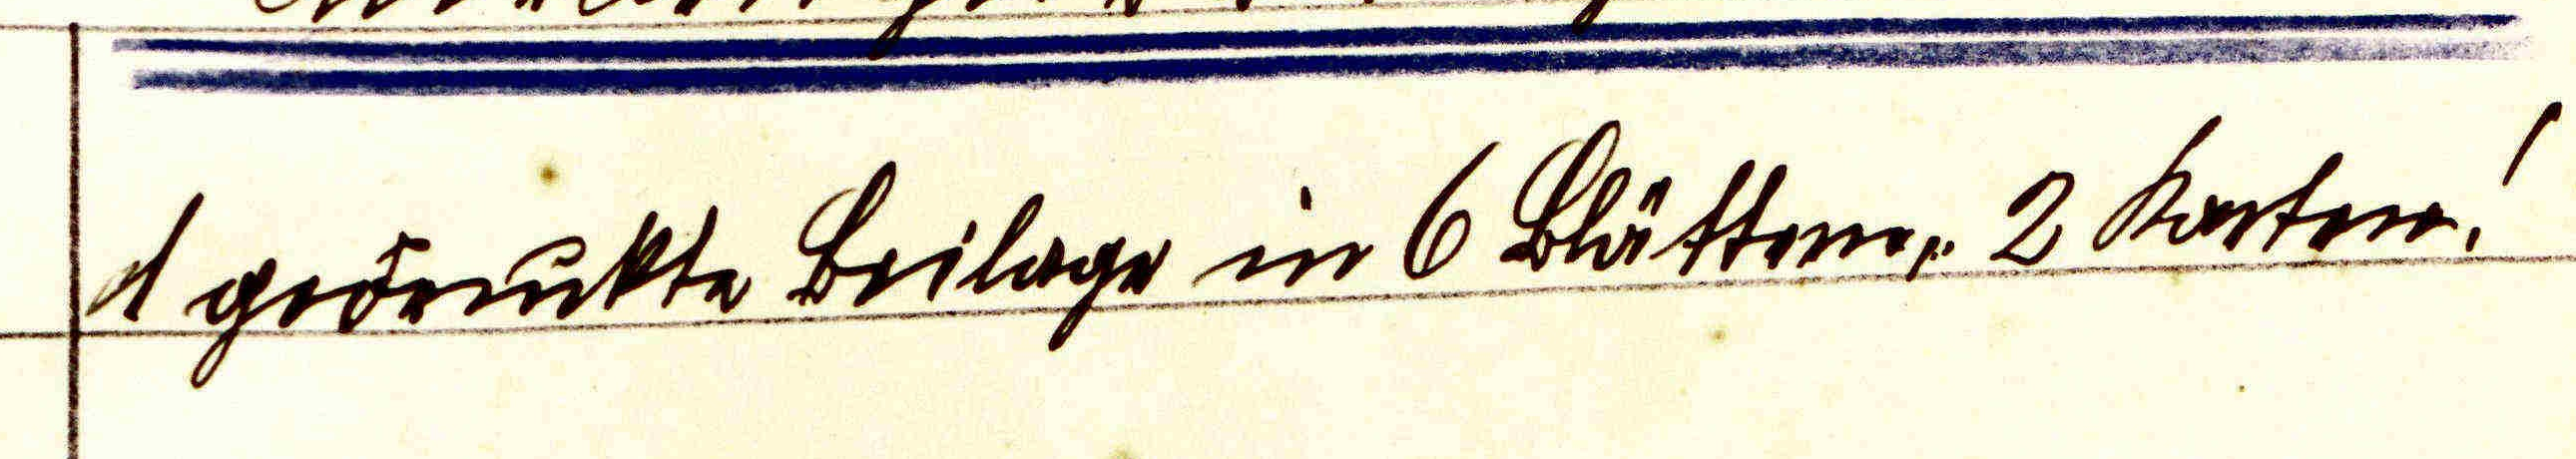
1 gedruckte Beilage in 6 Blättern, 2 Karten!
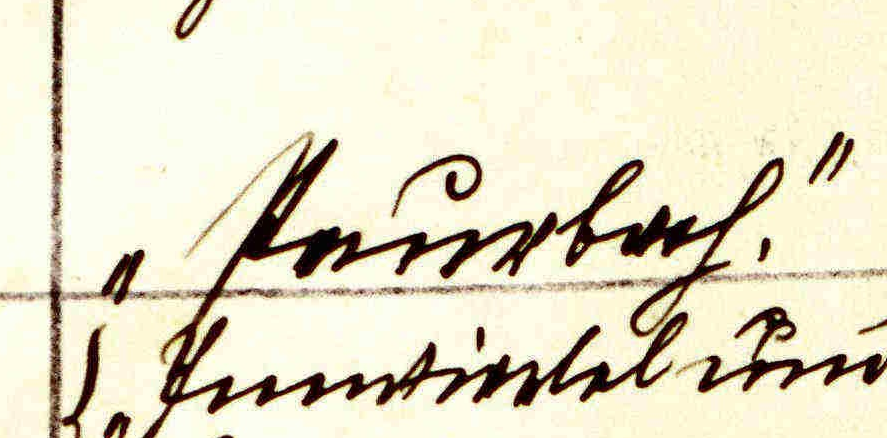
„Peuerbach“
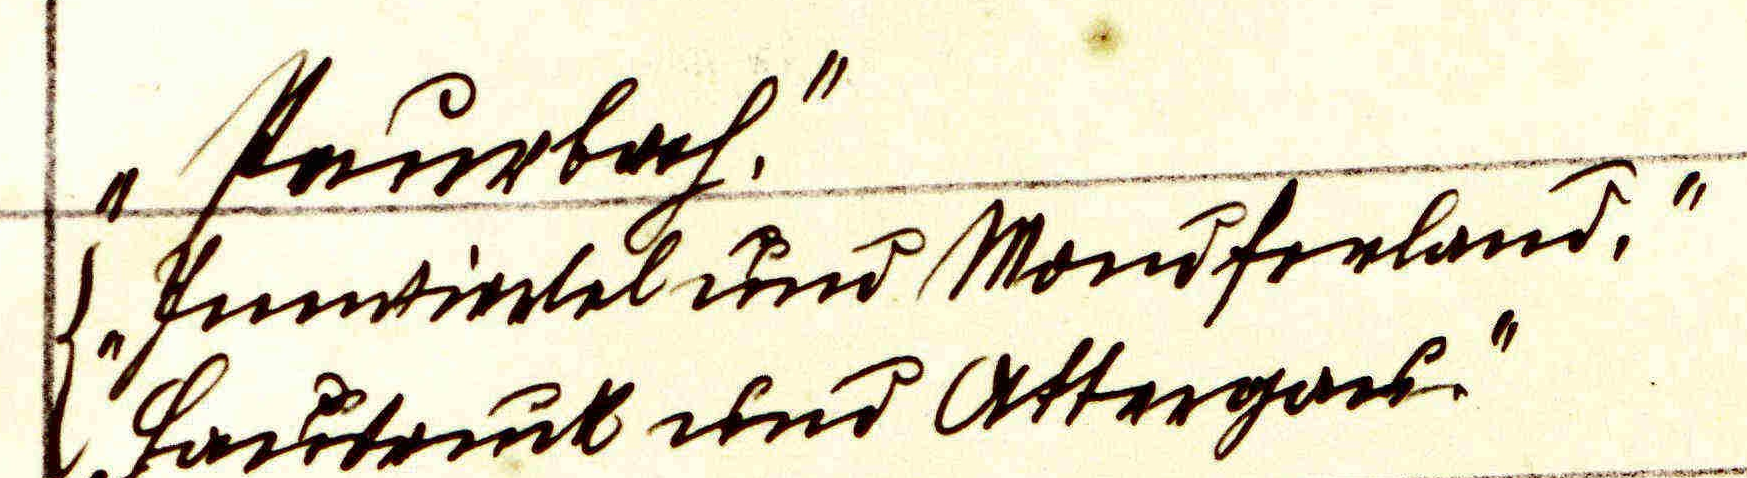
„Innviertel und Mondseeland“
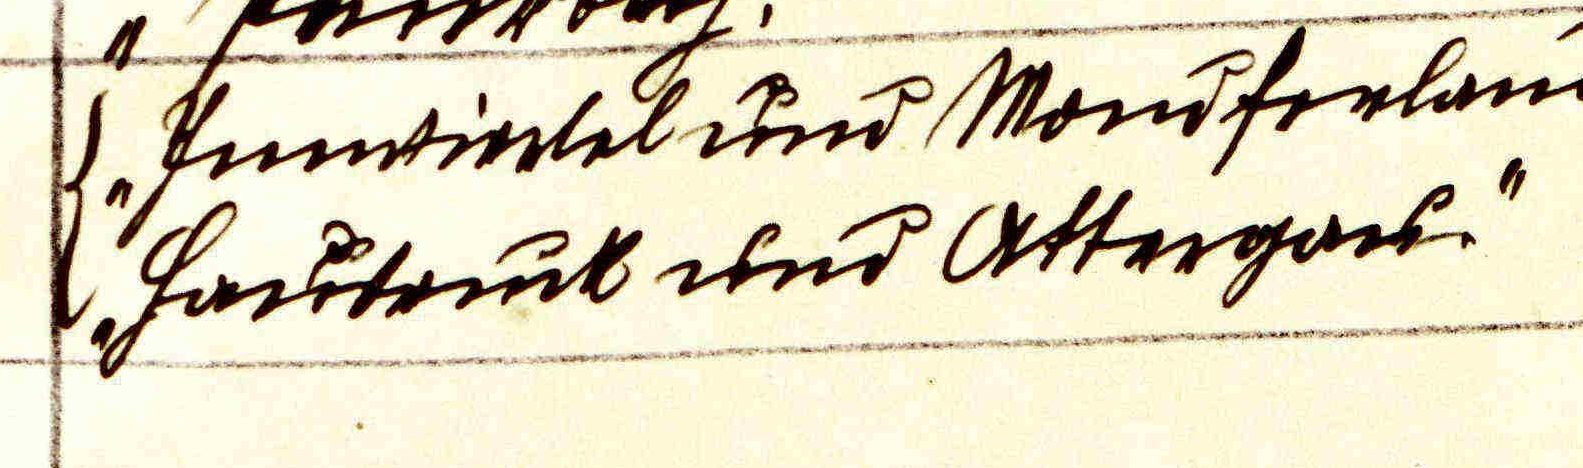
„Hausruck und Attergau“
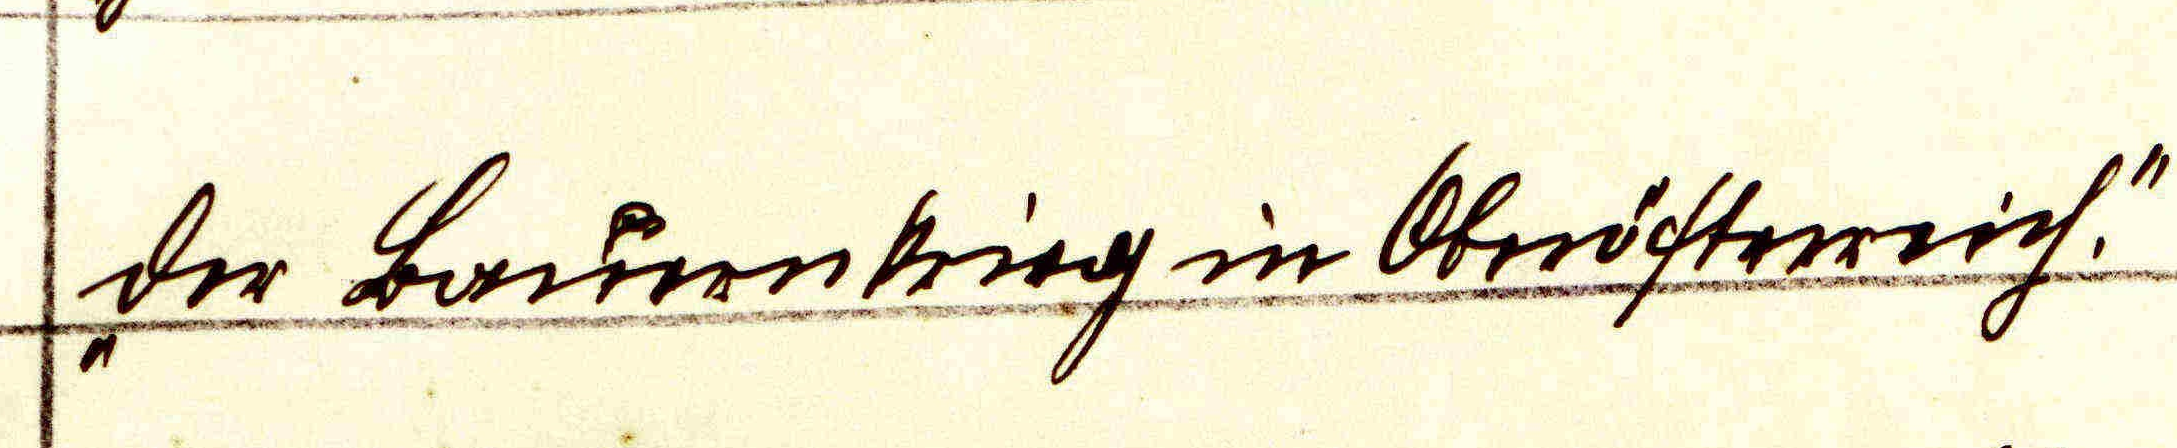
„Der Bauernkrieg in Oberösterreich“
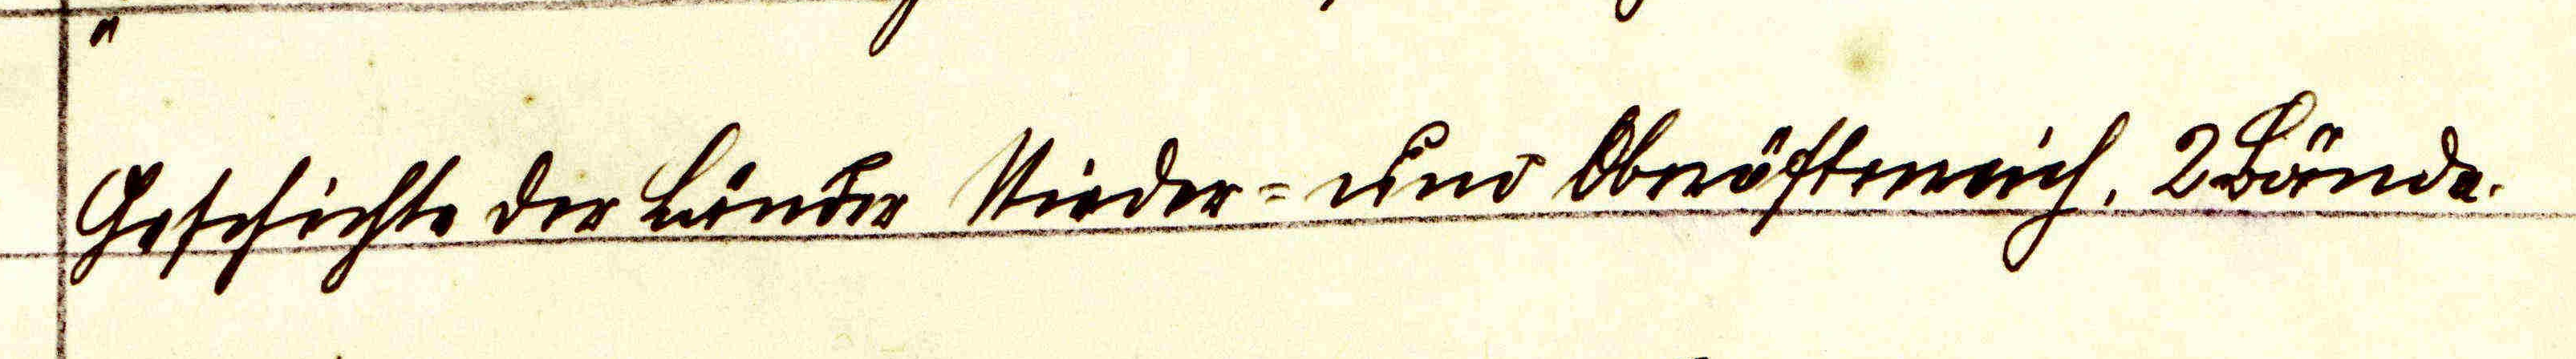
Geschichte der Länder Nieder- und Oberösterreich. 2 Bände
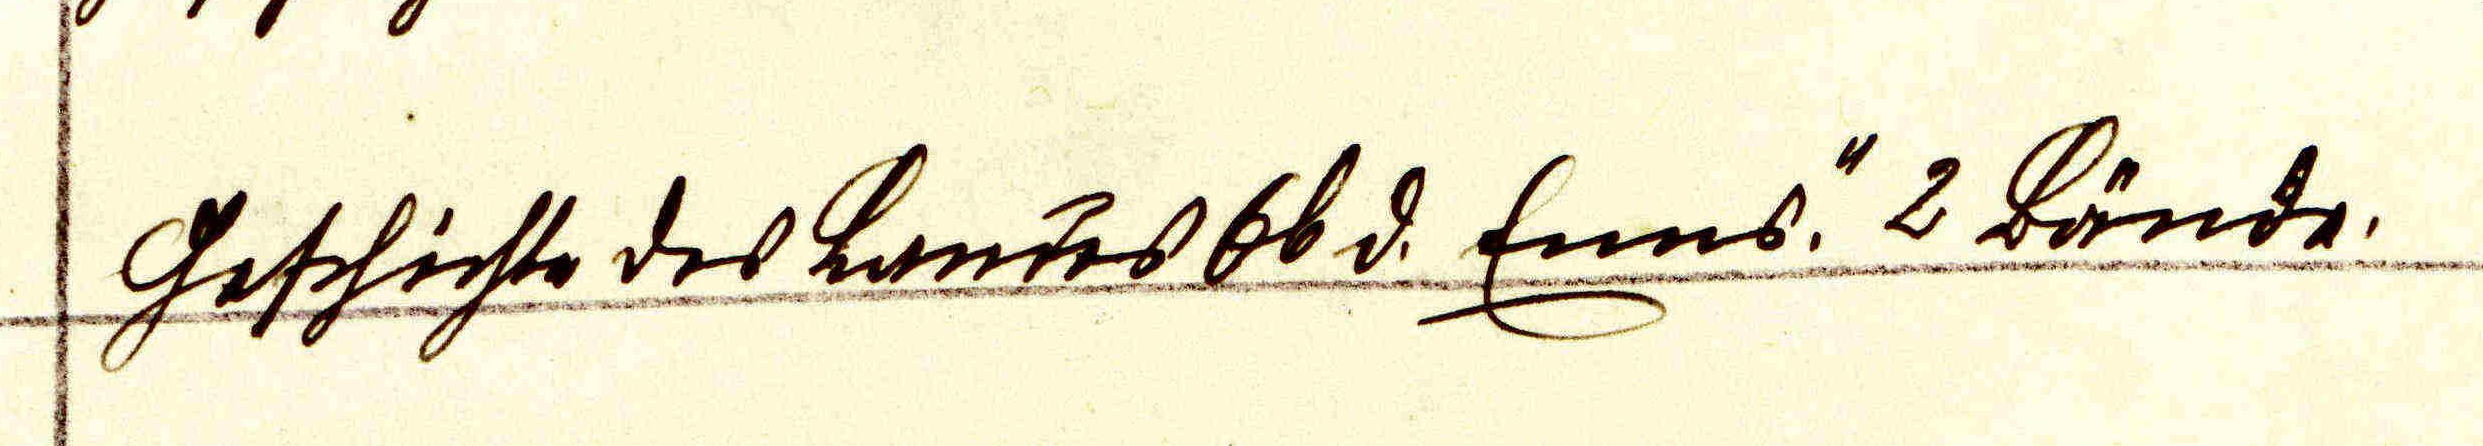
Geschichte des Landes ob d. Enns. 2 Bände
